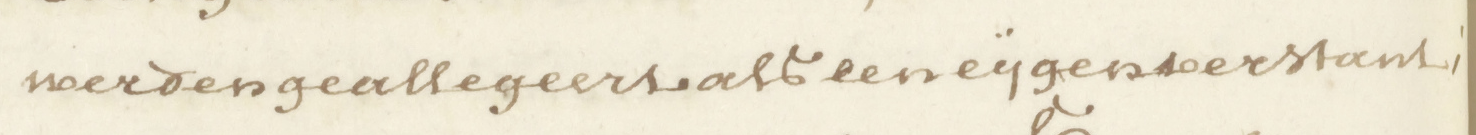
werden geallegeert als een eijgen verstant,
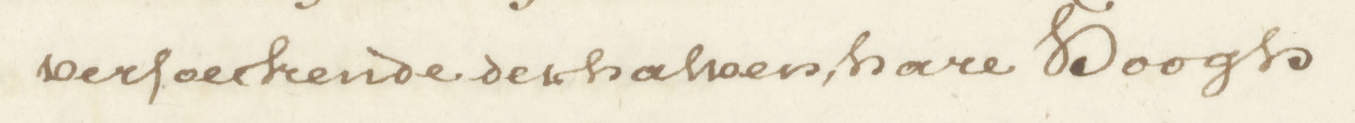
versoeckende derhalven hare Hoogh
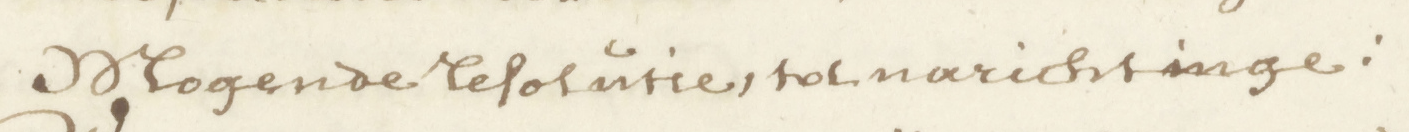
Mogende resolutie, tot narichtinge:
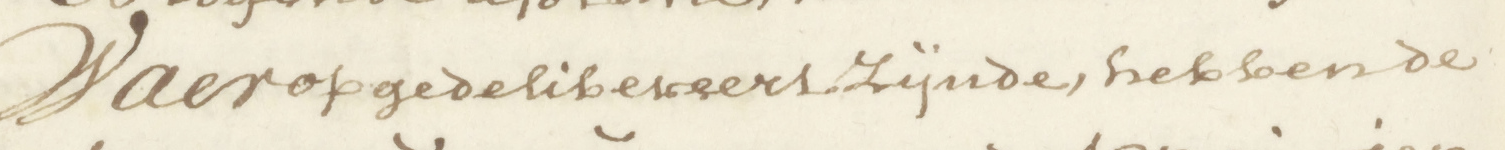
Waerop gedelibereert zijnde, hebben de
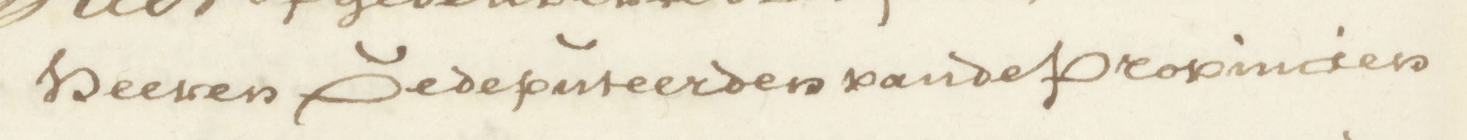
Heeren Gedeputeerden vande Provincien
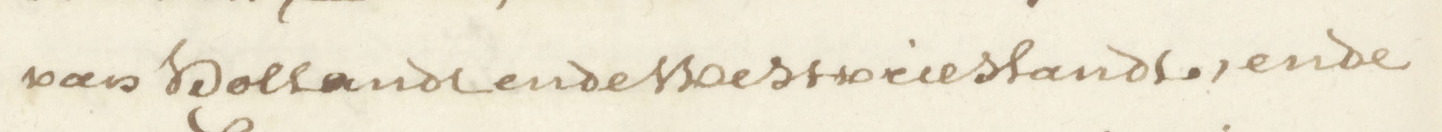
van Hollandt ende Westvrieslandt, ende
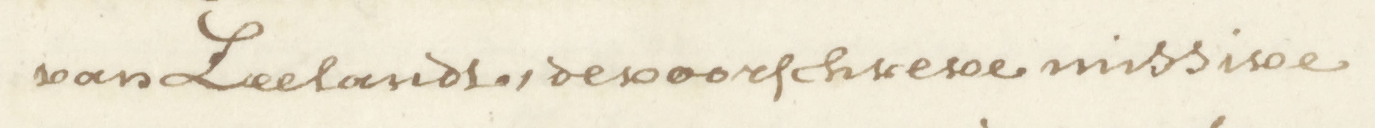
van Zeelandt, de voorschreve missive
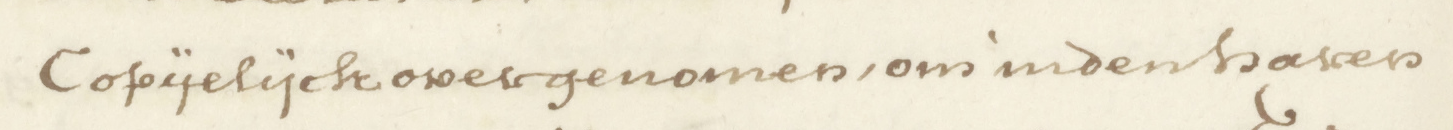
Copijelijck overgenomen, om inden haren
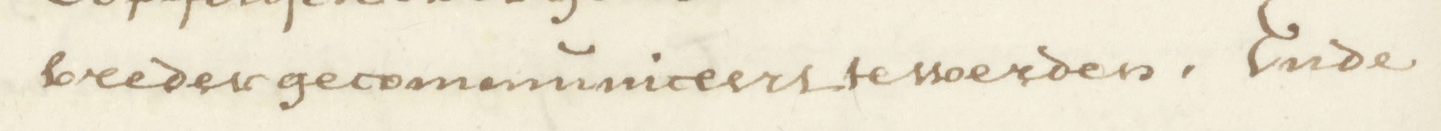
breder gecommuniceert te werden. Ende
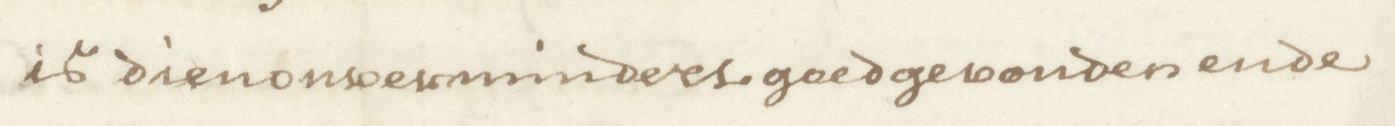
is dienonvermindert goedgevonden ende
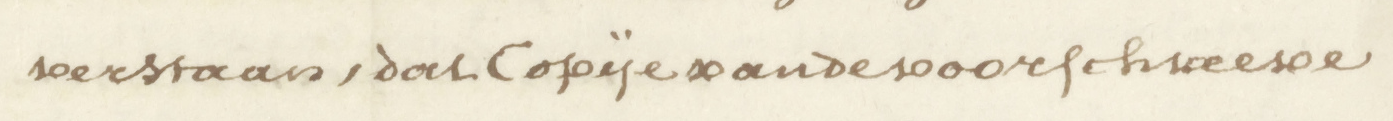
verstaan, dat Copije vande voorschreeve
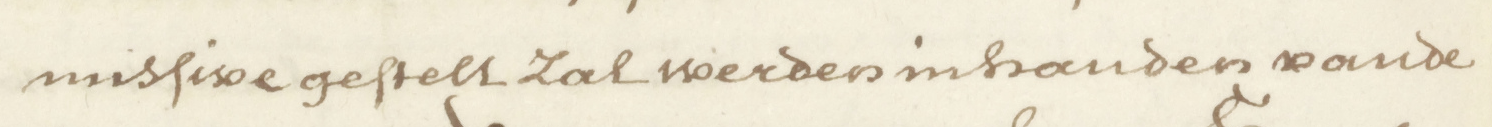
missive gestelt zal werden in handen vande
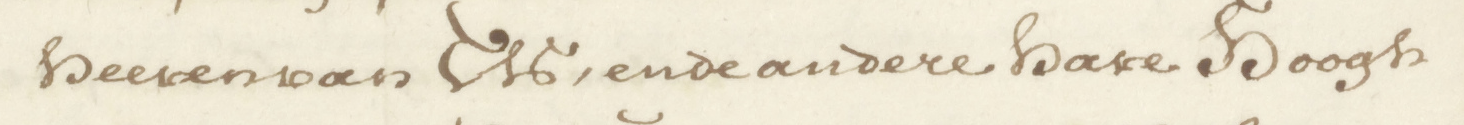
heeren van Els, ende andere hare Hoogh
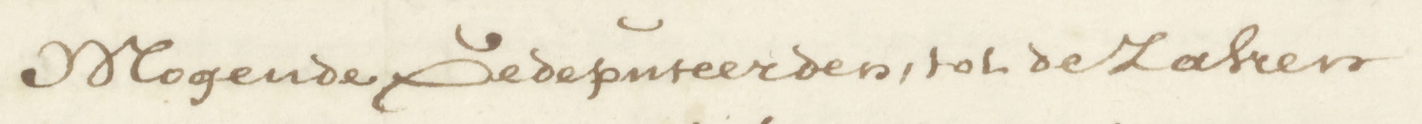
Mogende Gedeputeerden, tot de zaken
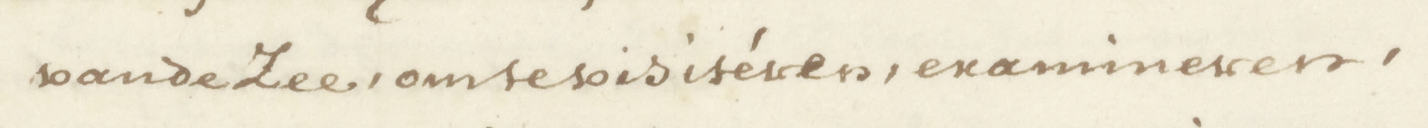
vande zee, om te visiteren, examineren,
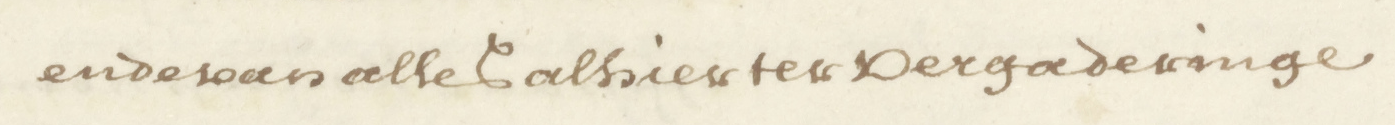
ende van alles alhier ter vergaderinge
